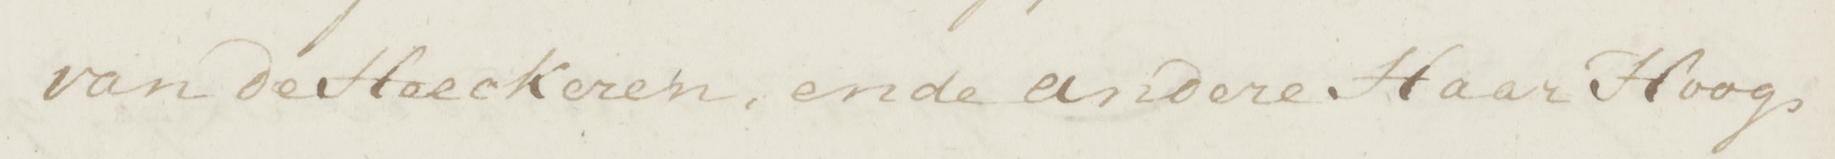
van de Heeckeren, ende andere Haar Hoog
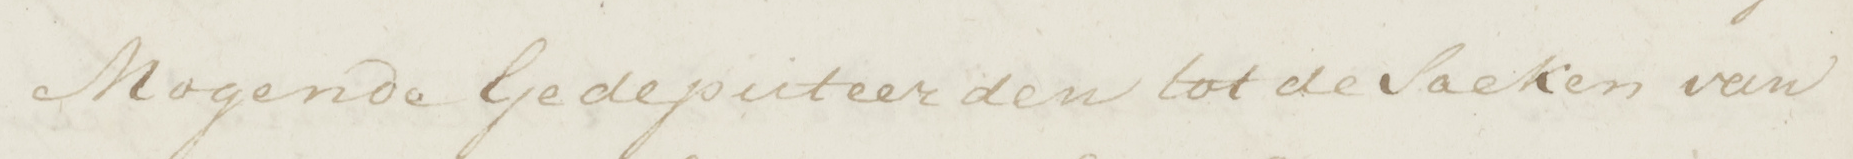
Mogende Gedeputeerden tot de saeken van
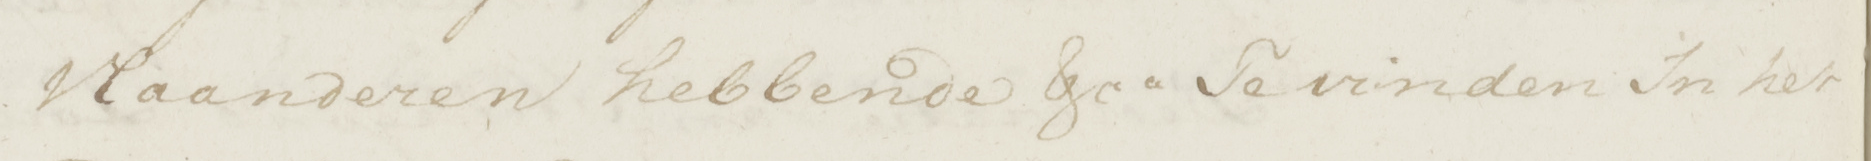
Vlaanderen hebbende &ca. Te vinden In het
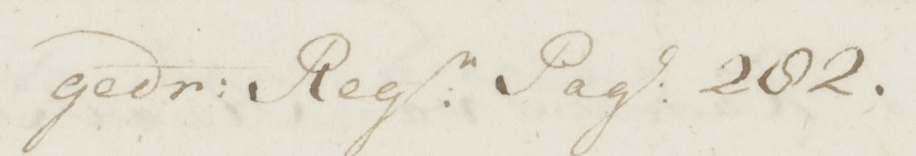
gedr: Regr: Pag: 282.
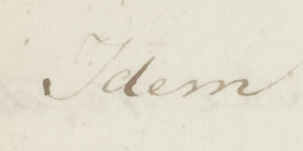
Idem
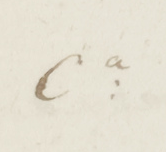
Ca:
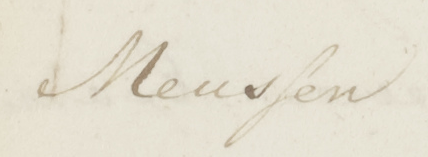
Meussen
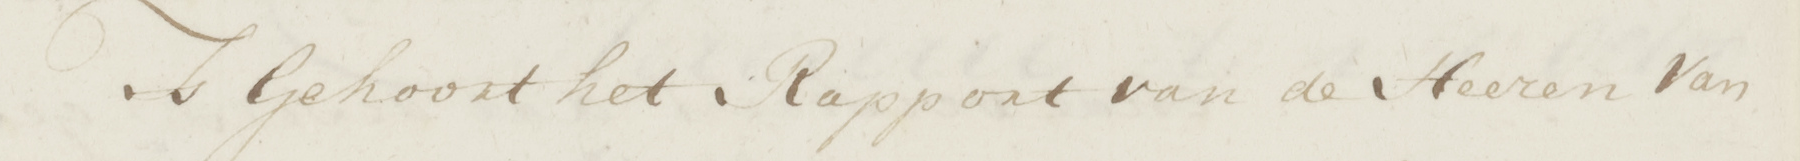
Is gehoort het Rapport van de Heeren van
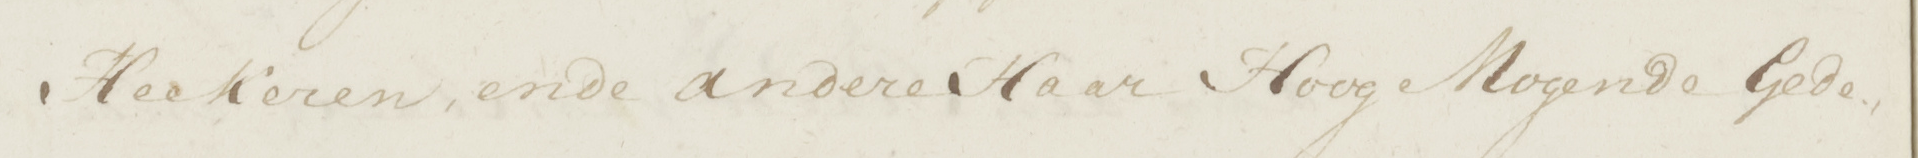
Heekeren, ende andere Haar Hooge Mogende Gede„
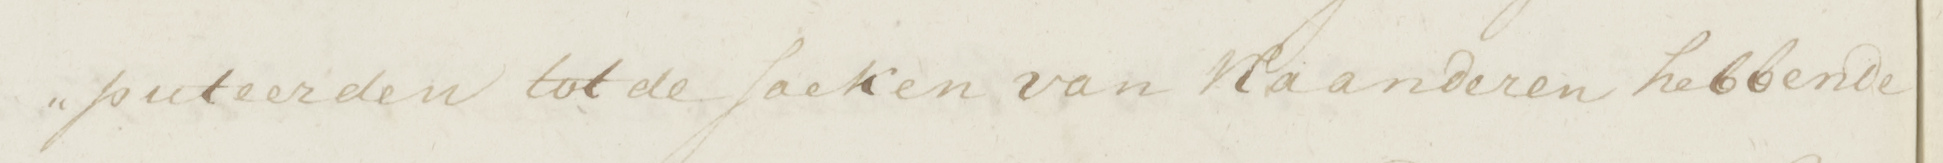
„puteerden tot de caeken van vlaanderen hebbende
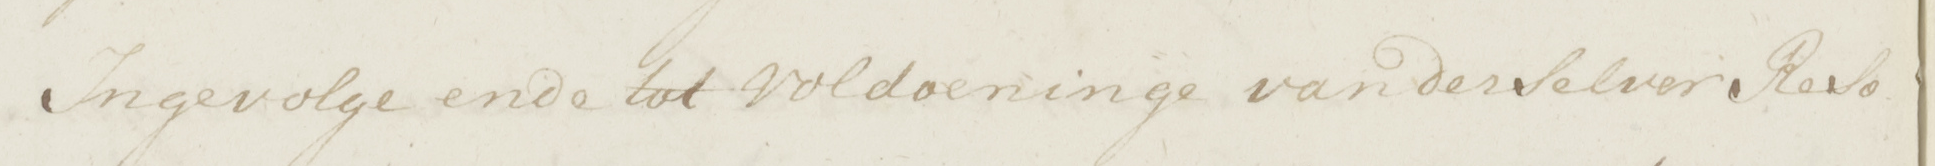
Ingevolge ende tot voldoeninge van derselver Reso
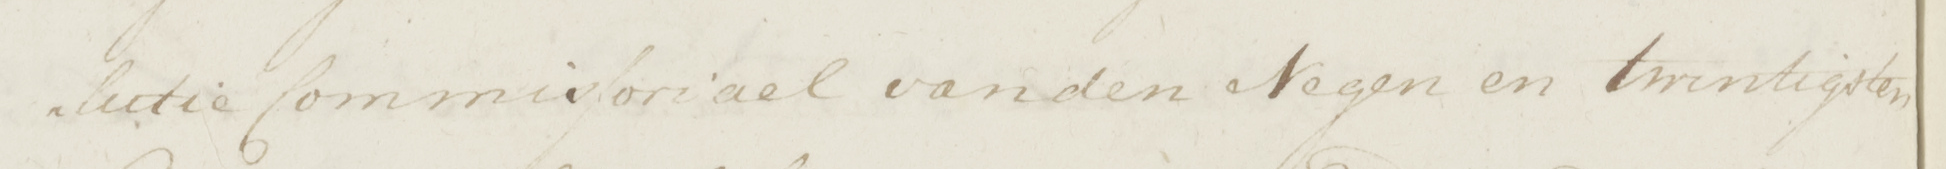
lutie Commisoriael vanden Negen en twintigsten
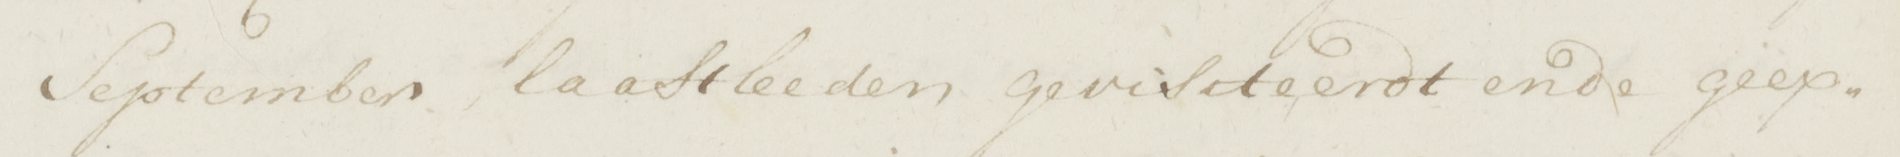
September, laastleeden gevisiteerdt ende geex„
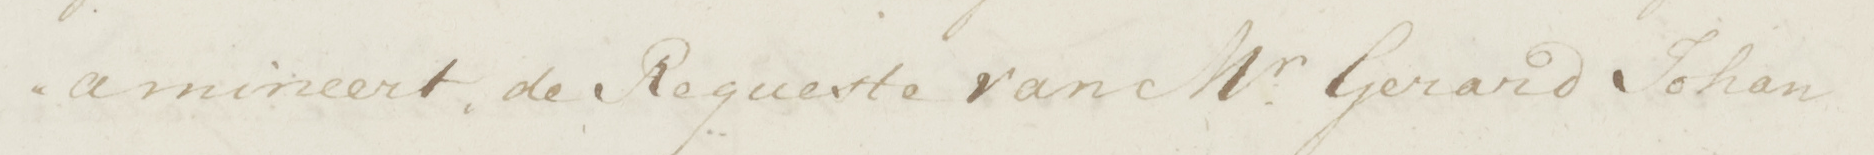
„amineert, de Requeste van Mr. Gerard Johan
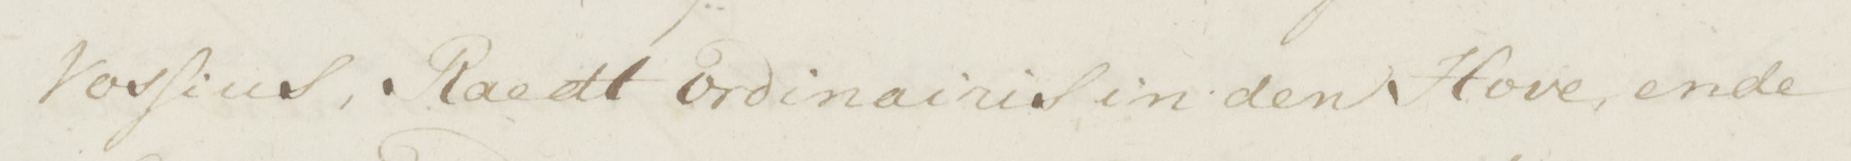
Vossius, Raedt ordinairis in den Hove, ende
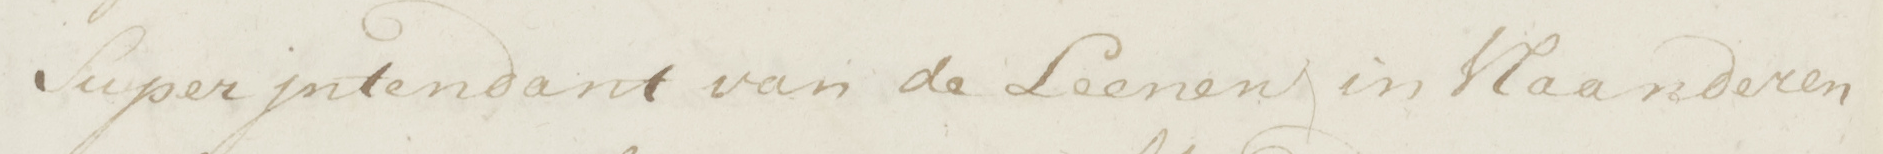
super intendant van de Leenen in Vlaanderen
